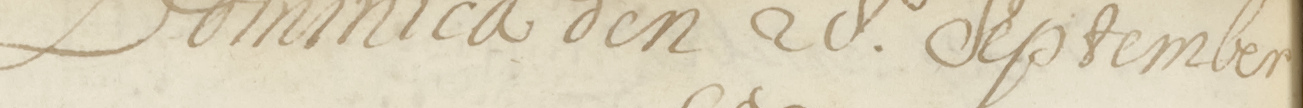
Dominica den 28en. September
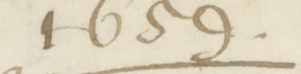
1659.
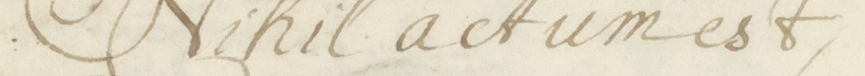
Nihil actum est
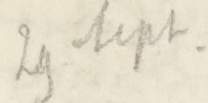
29 sept.
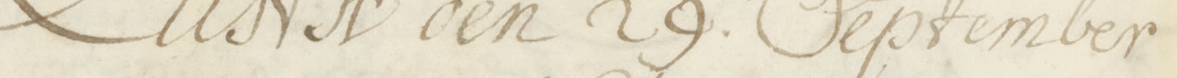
Lunæ den 29en. September
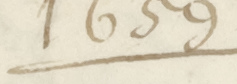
1659.
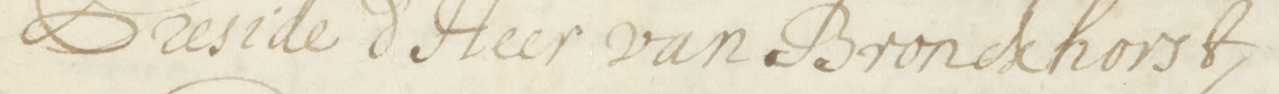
Preside d'Heer van Bronckhorst,
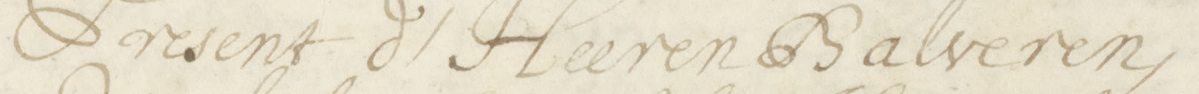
Present d'Heeren Balveren,
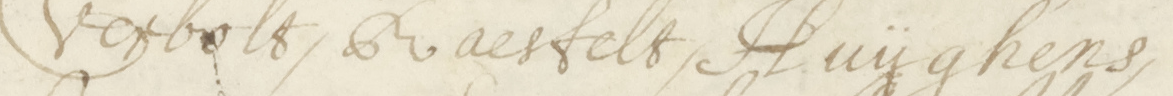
Verbolt, Raesfelt, Huijghens,
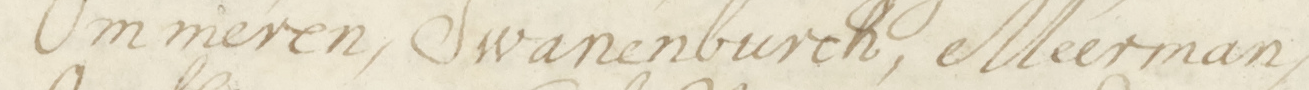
Ommeren, Swanenburch, Meerman,
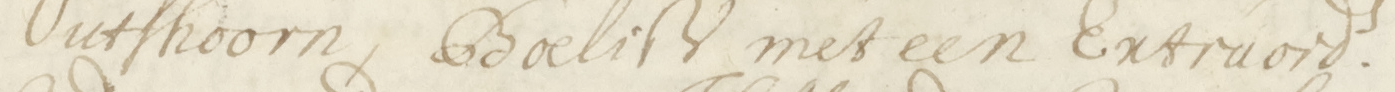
Outshoorn, Boelis met een Extraords.
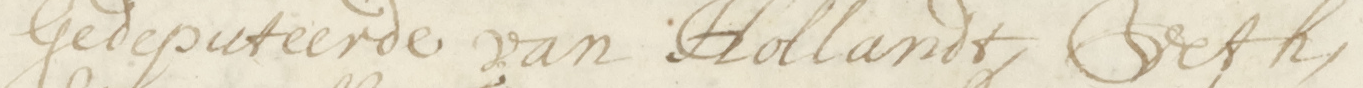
Gedeputeerde van Hollandt, Veth,
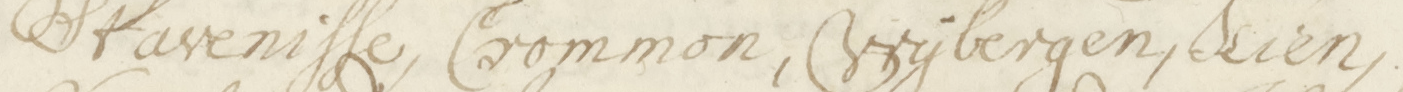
Stavenisse, Crommon, Vrijbergen, Kien,
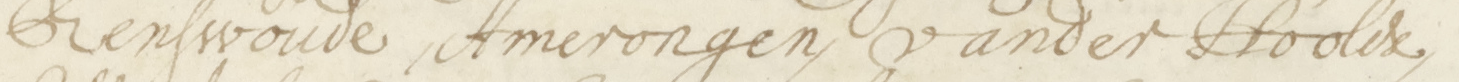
Renswoude, Amerongen, vander Hoolck,
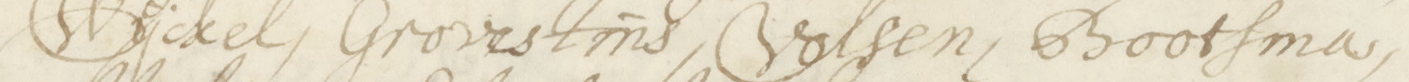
Wijckel, Grovestins, Velsen, Bootsma,
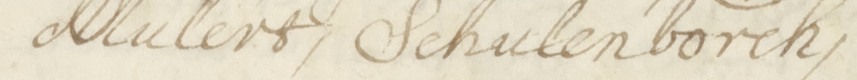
Mulert, Schulenborch,
